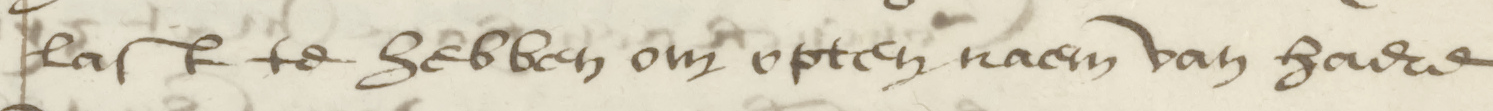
last te hebben om opten naem van haere
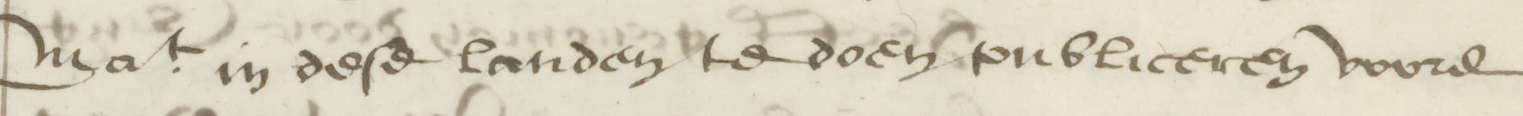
Mat. in dese landen te doen publiceren voorde
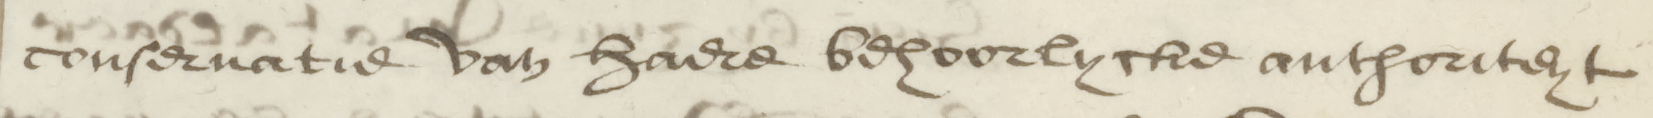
conseruatie van haere behoorlycke authoriteyt
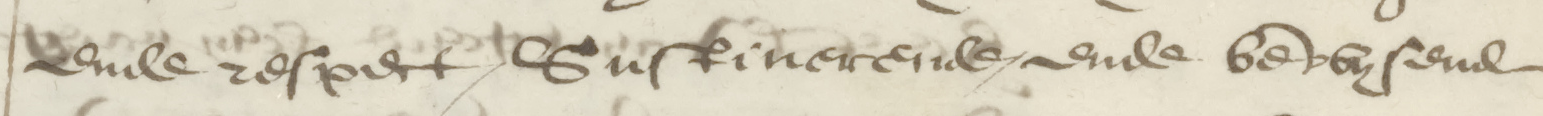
ende respect, Sustinerende, ende bewysende
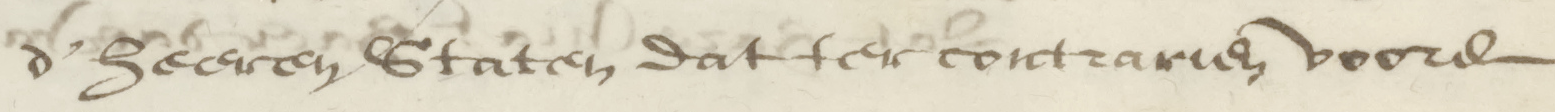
d'heeren Staten, dat ter contrarien voorde
